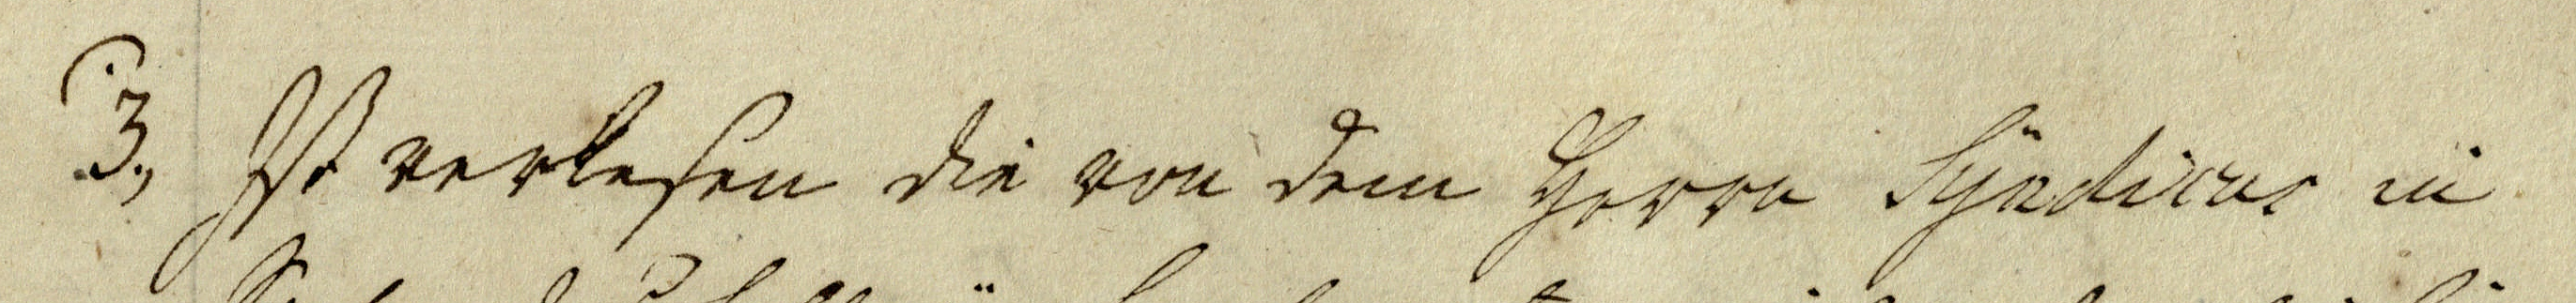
3., Ist verlesen die von dem Herrn Sÿndicus in
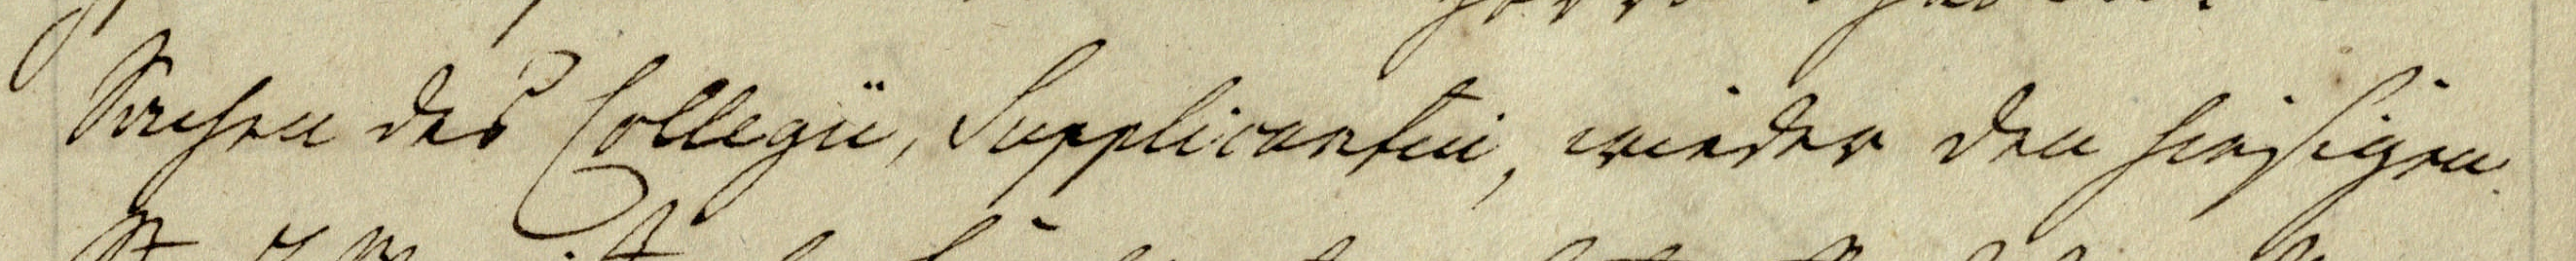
Sachen des Collegii, Supplicantin, wieder den hiesigen
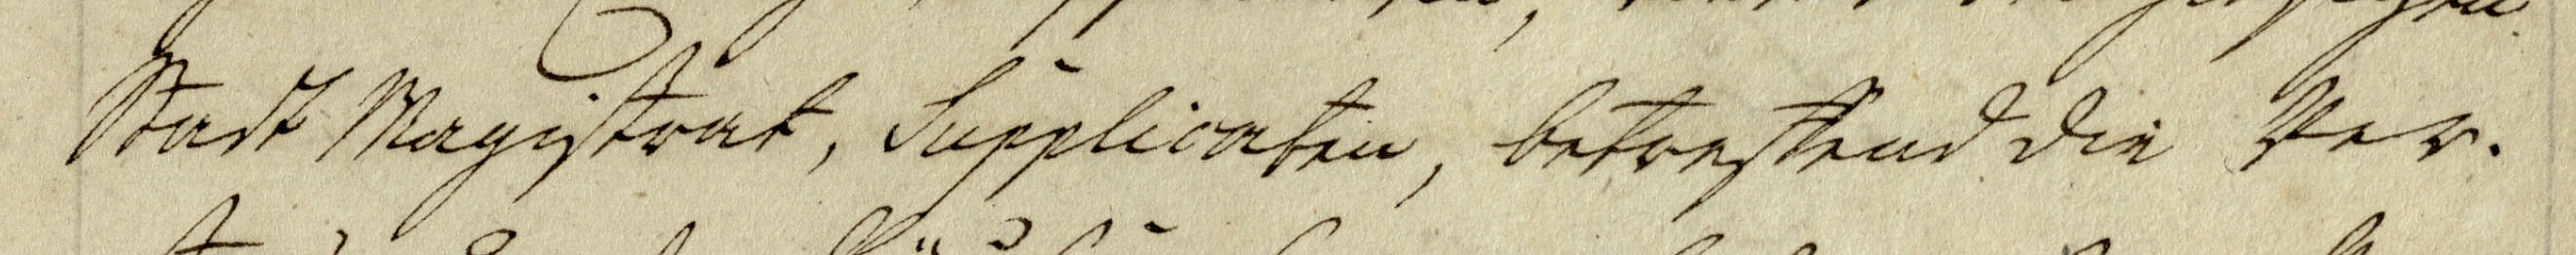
Stadt Magistrat, Supplicaten, betreffend die Ver¬
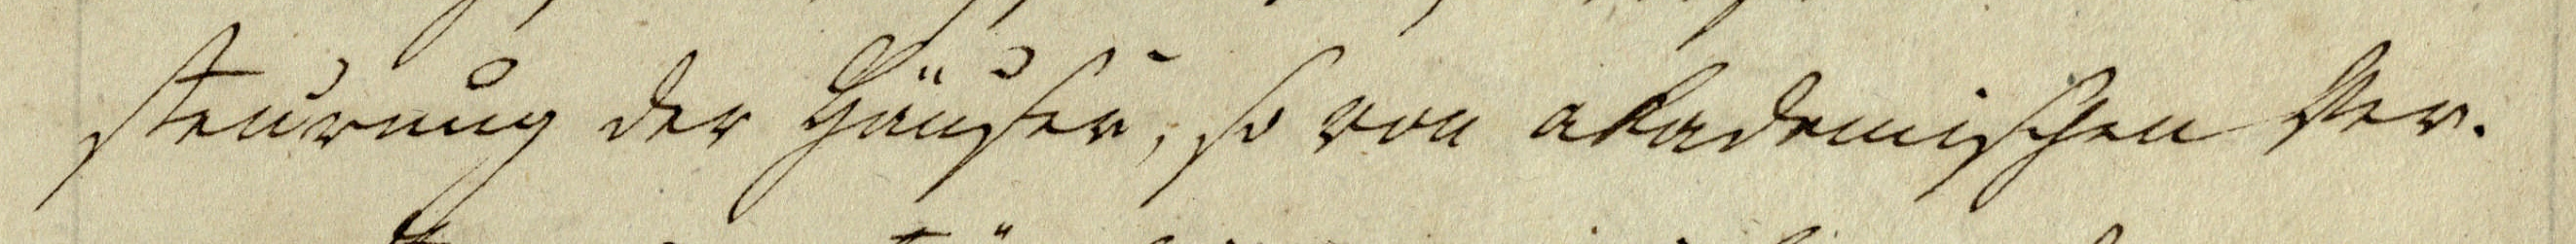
steurung der Häuser, so von akademischen Ver¬
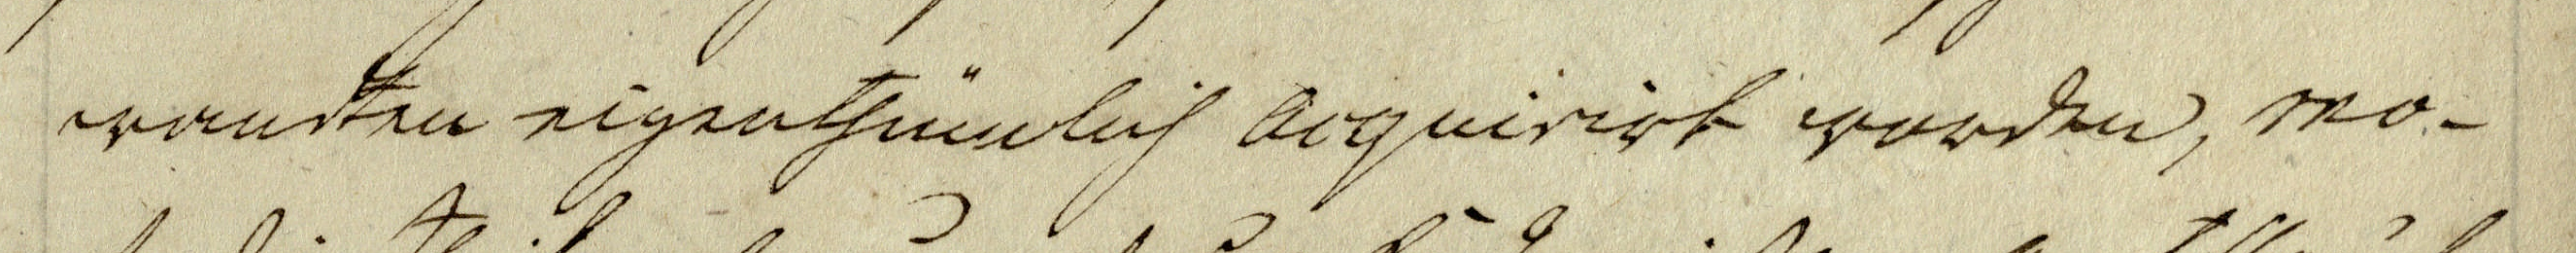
wandten eigenthümlich aquirirt worden, mo¬
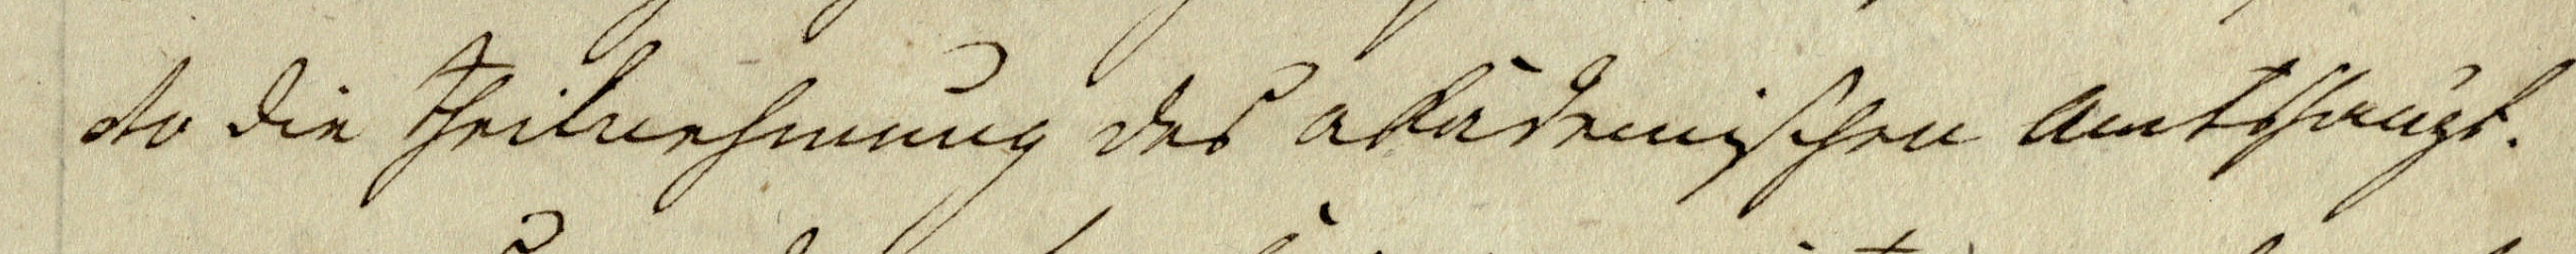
do die Theilehmung des akademischen Amtshaupt¬
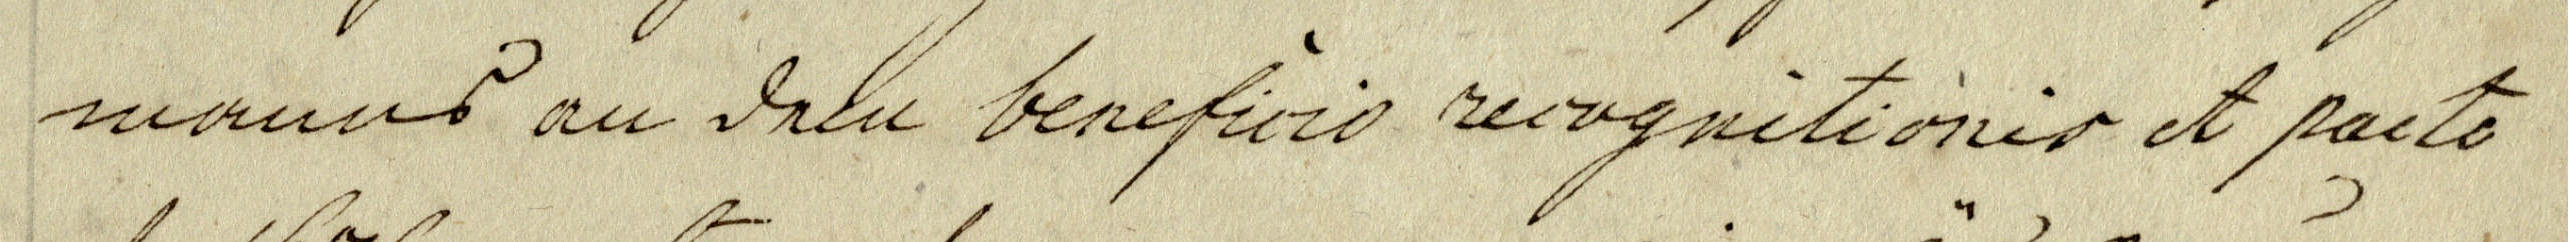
manns an dem beneficio recognitionis et paeto
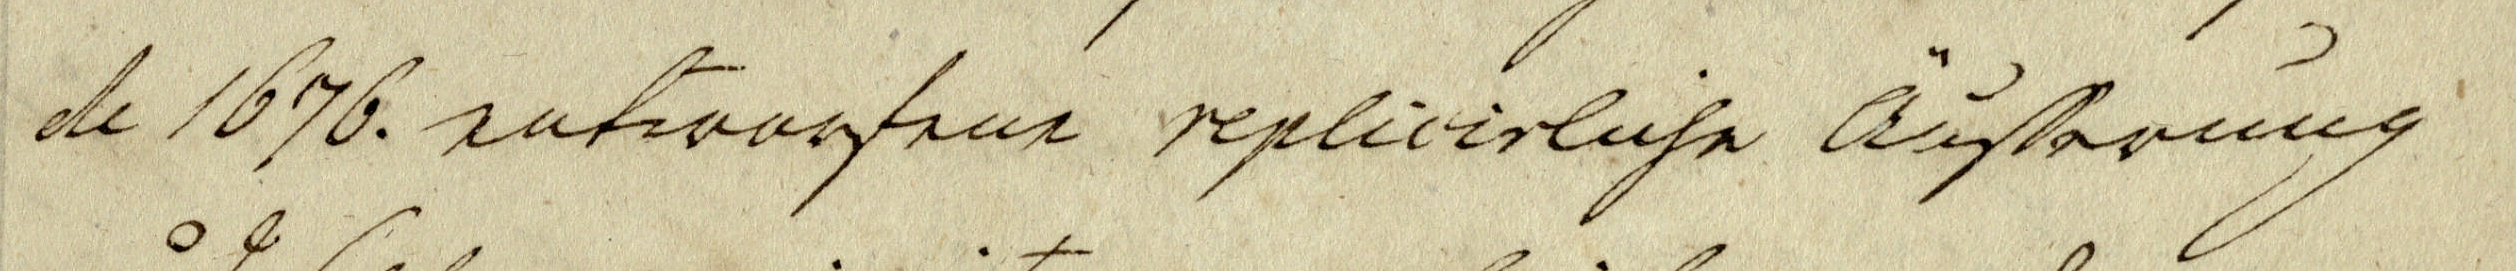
de 1676. entworfene replicirliche Äusserung
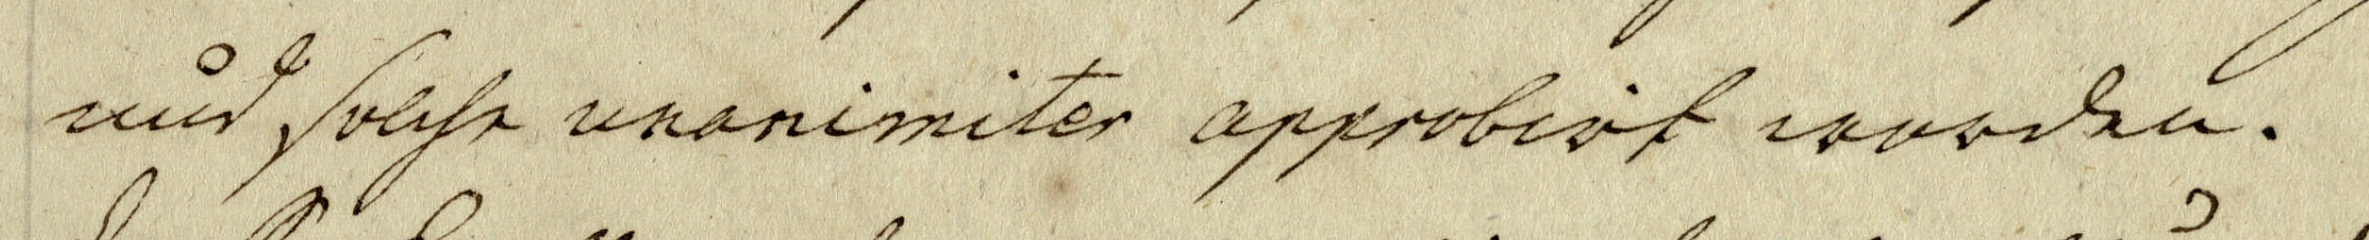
und solche unanimiter approbirt worden.
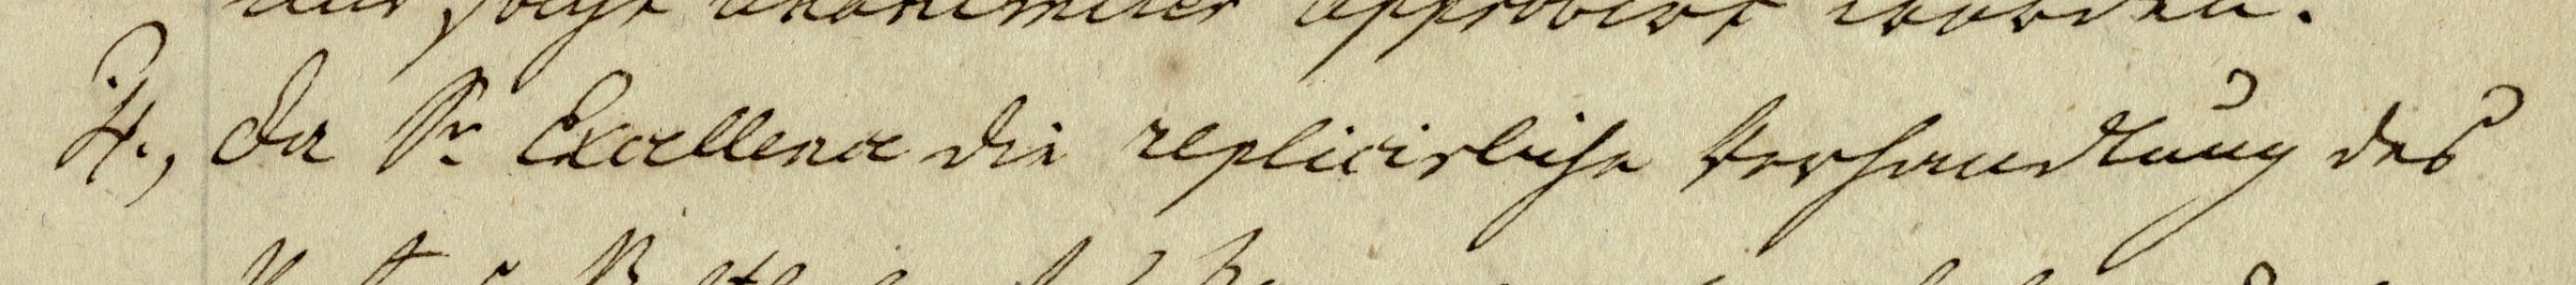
4., Da Sr Excellence die replicirliche Verhandlung des
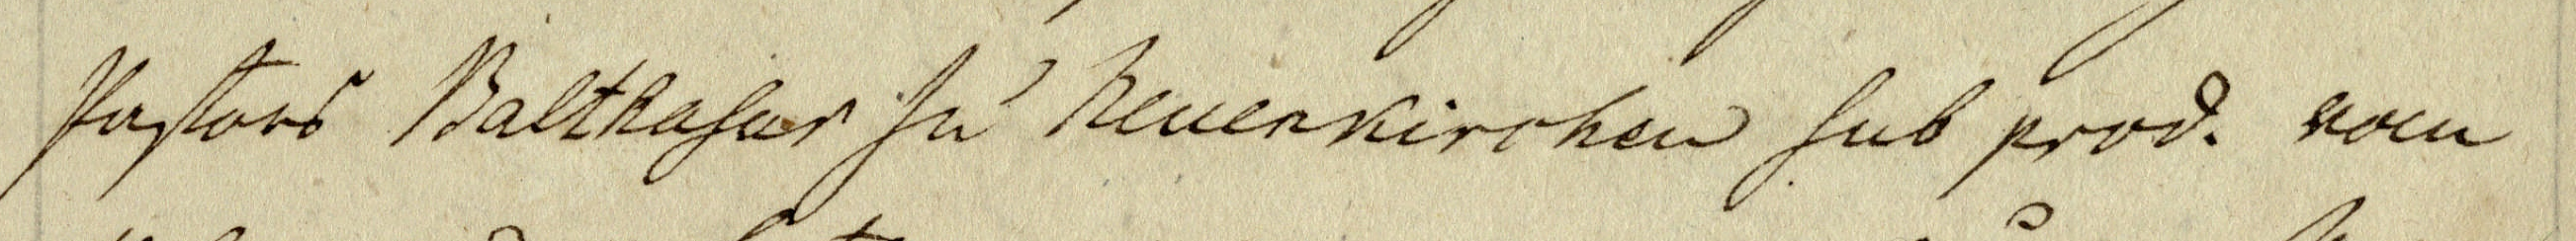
Pastors Balthasur zu Neuenkirchen sub prod. vom
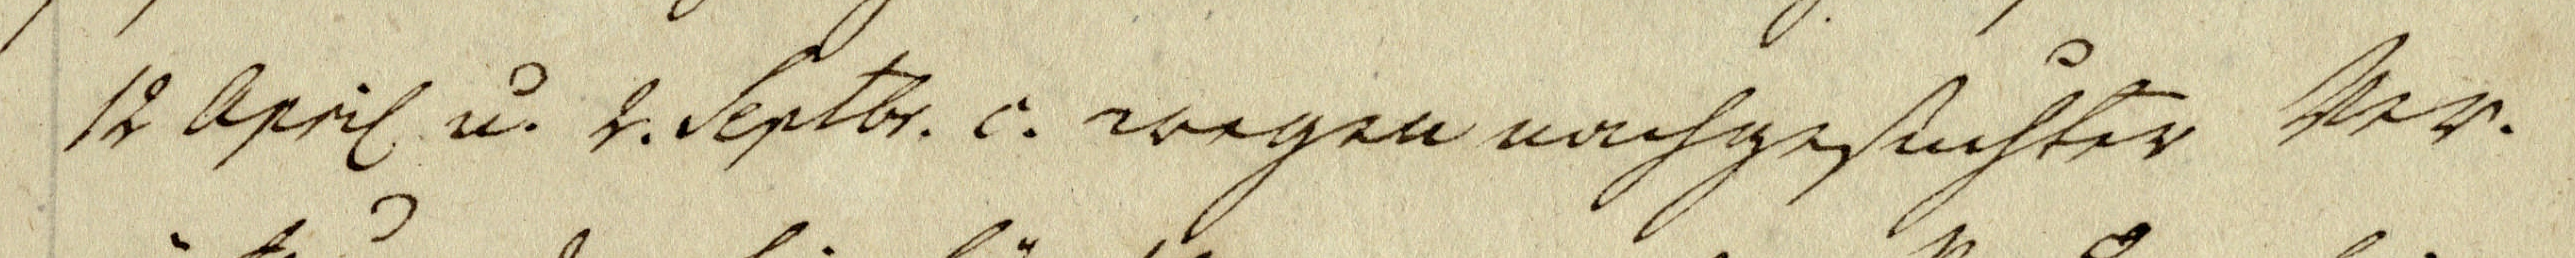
12 April, u. 2. Septbr. c. wegen nachgesuchter Ver¬
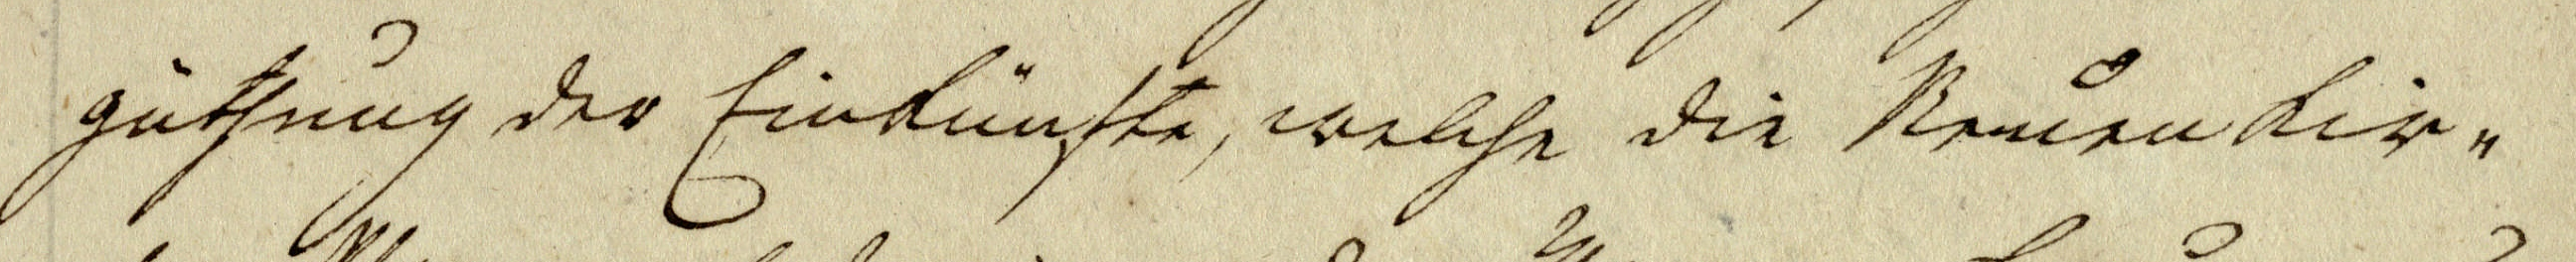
güthung der Einkünfte, welche die Neuenkir¬
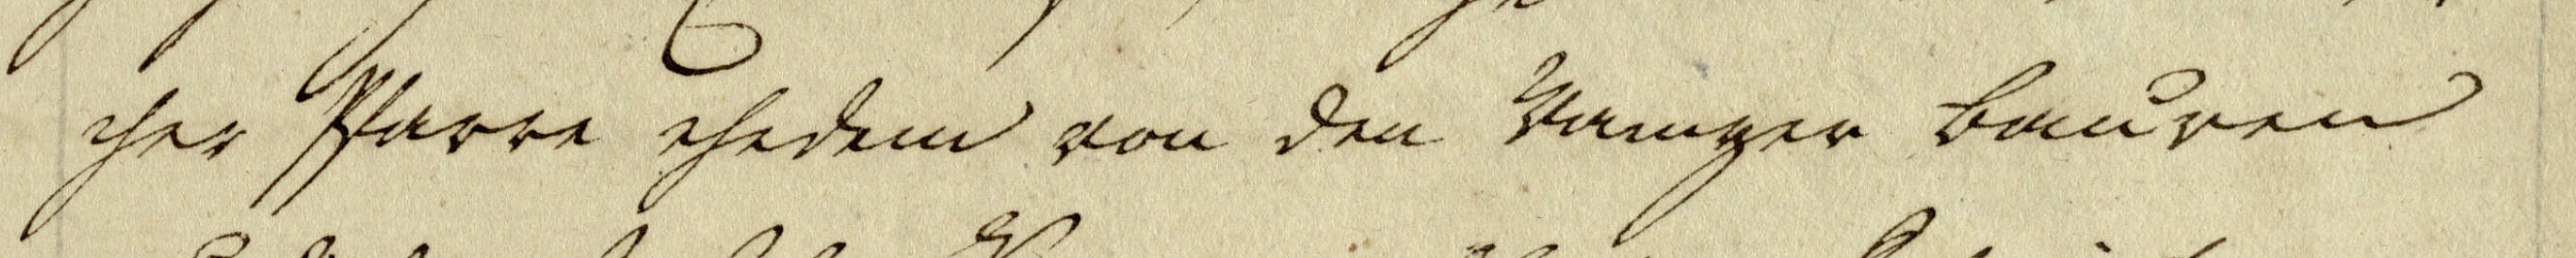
cher Pfarre ehedem von den Wamper Bauren
